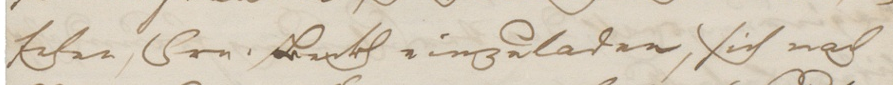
sehen, Hrn. Beckh einzuladen, sich nach
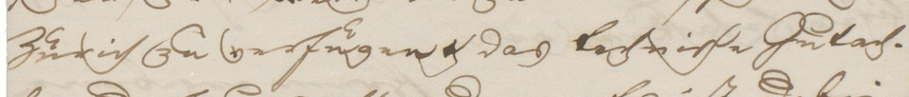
Zürich zu verfügen & das technische Gutach-
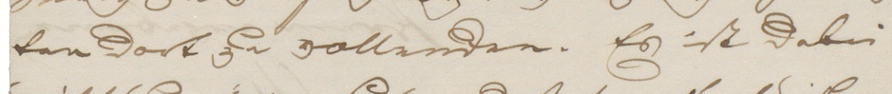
ten dort zu vollenden. Es ist dabei
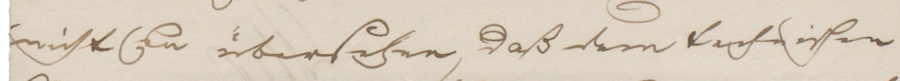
nicht zu übersehen, daß dem technischen
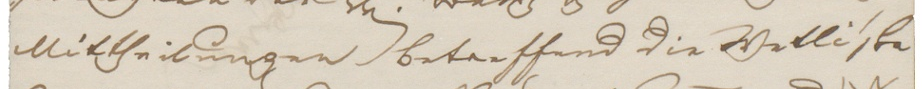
Mittheilungen betreffend die Wetli'sche
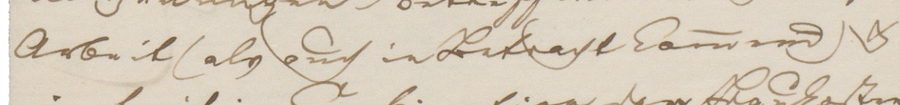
Arbeit (als auch in Betracht commend) &
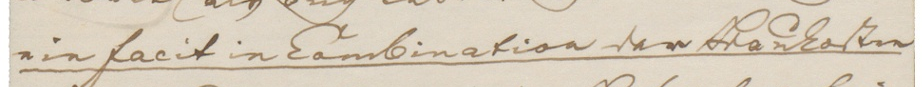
ein facit in Combination der Baukosten
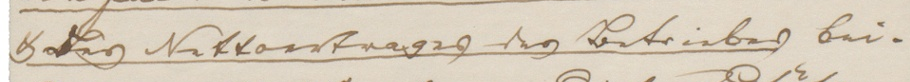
& des Nettoertrages des Betriebes bei-
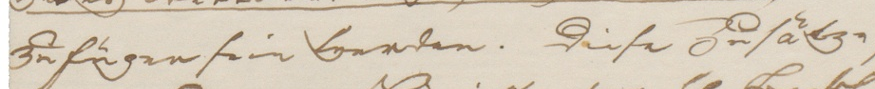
zufügen sein werden. Die Zusätze,
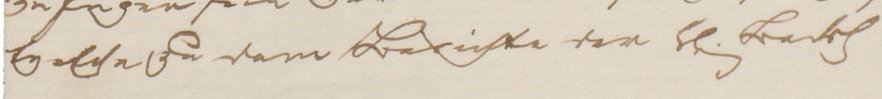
welche zu dem Berichte der HH. Beckh
